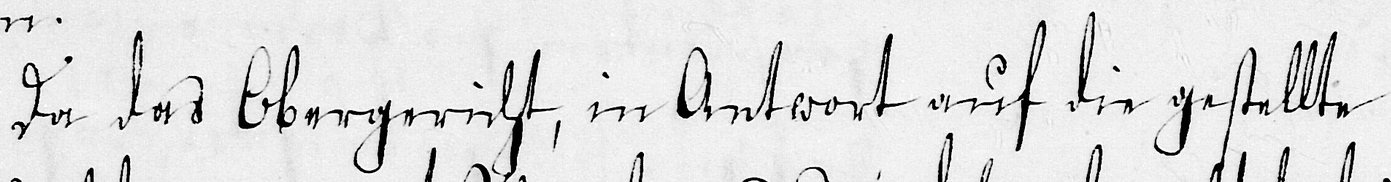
Da das Obergericht, in Antwort auf die gestellte
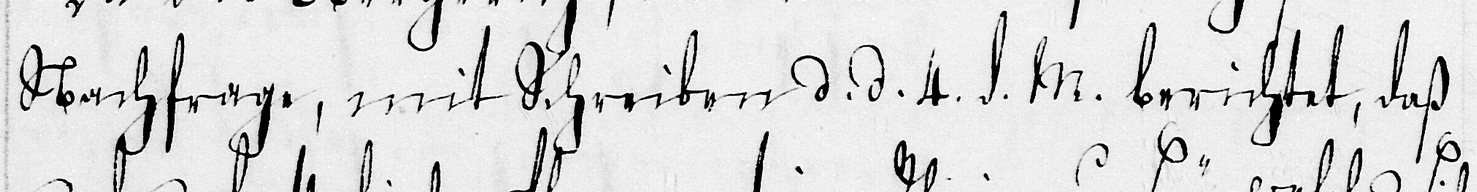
Nachfrage, mit Schreiben d. d. 4. d. M. berichtet, daß
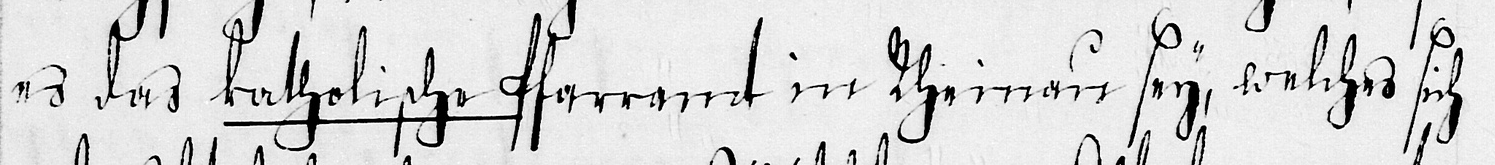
es das katholische Pfarramt in Rheinau sey, welches sich
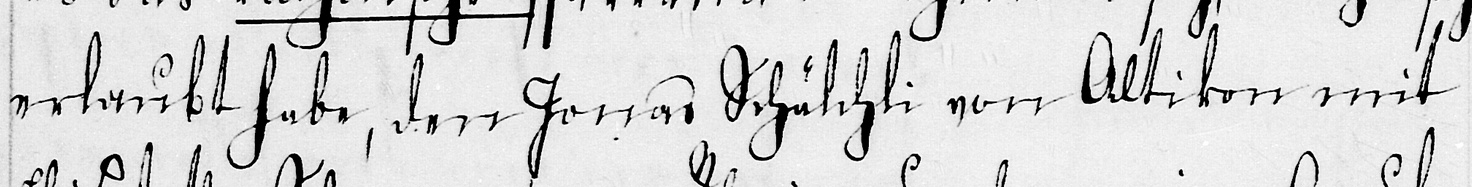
erlaubt habe, den Jonas Schälchli von Altikon mit
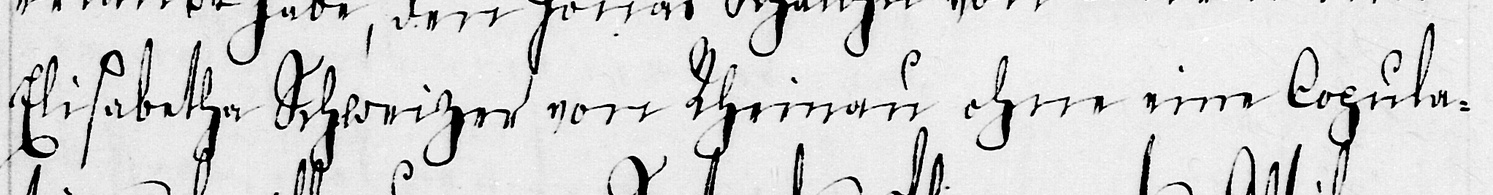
Elisabetha Schweizer von Rheinau ohne eine Copula¬
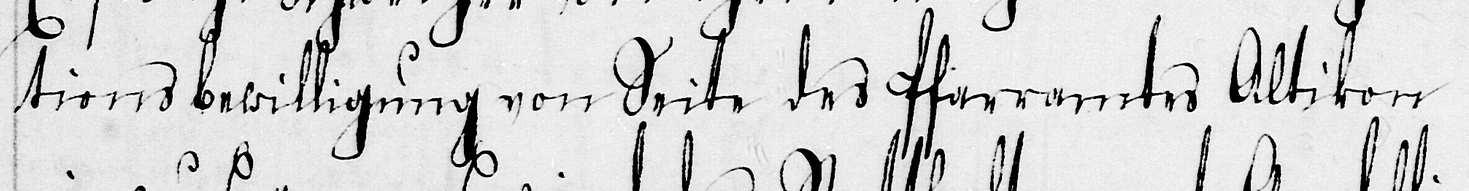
tionsbewilligung von Seite des Pfarramtes Altikon
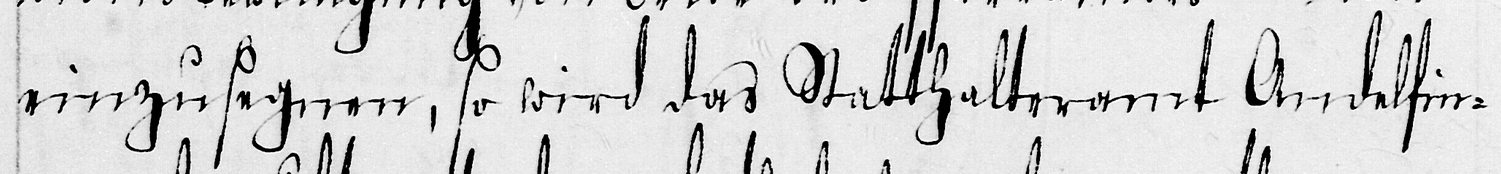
einzusegnen, so wird das Statthalteramt Andelfin¬
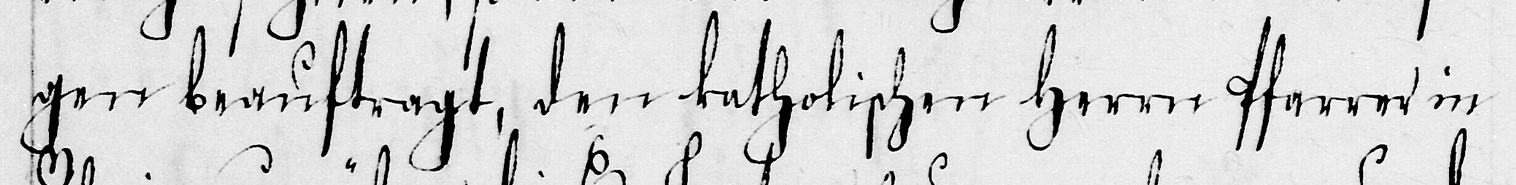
gen beauftragt, den katholischen Herrn Pfarrer in
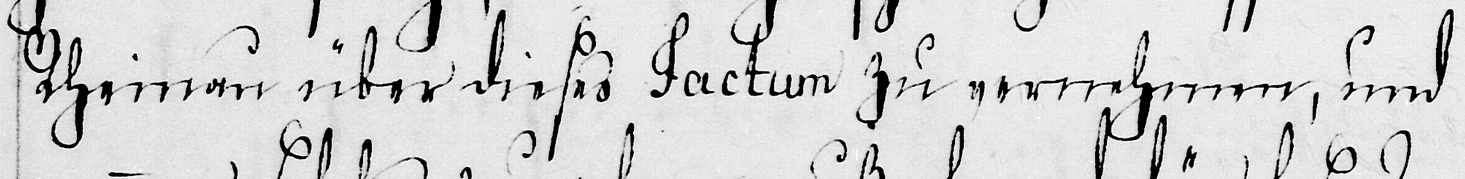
Rheinau über dieses Factum zu vernehmen, und
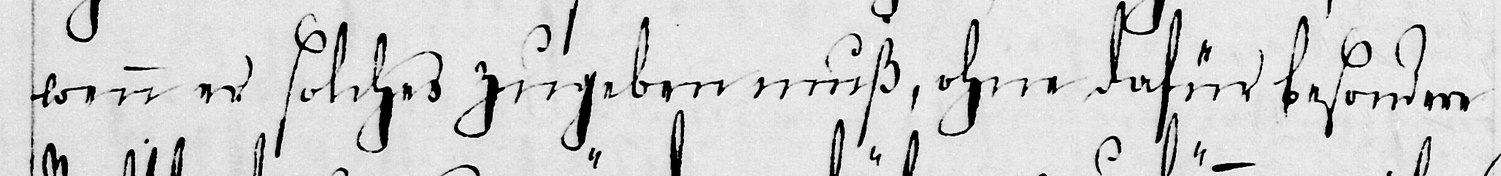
wenn er solches zugeben muß, ohne dafür besondere
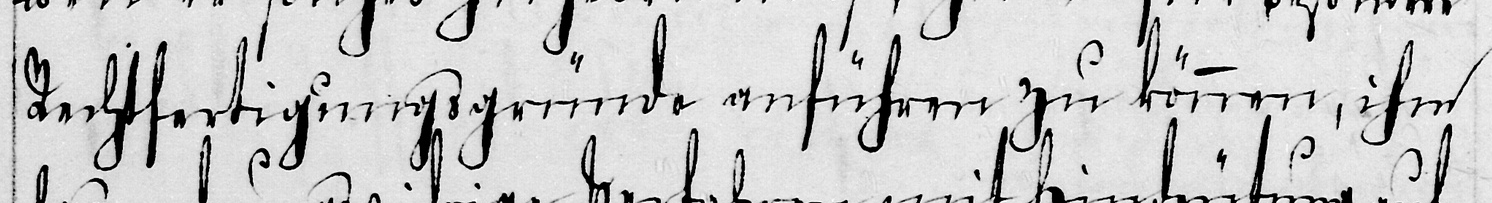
Rechtfertigungsgründe anführen zu können, ihm
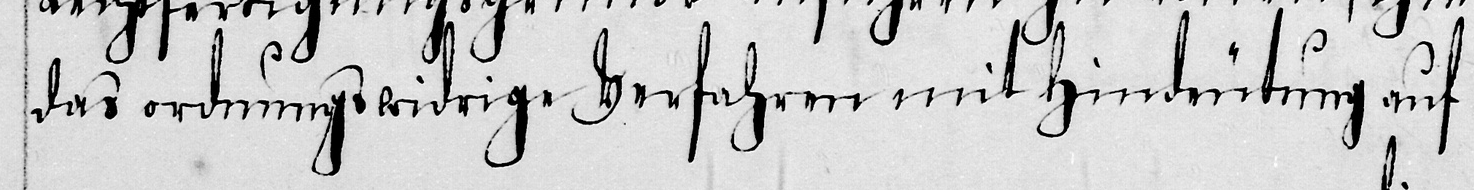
das ordnungswidrige Verfahren mit Hindeutung auf
